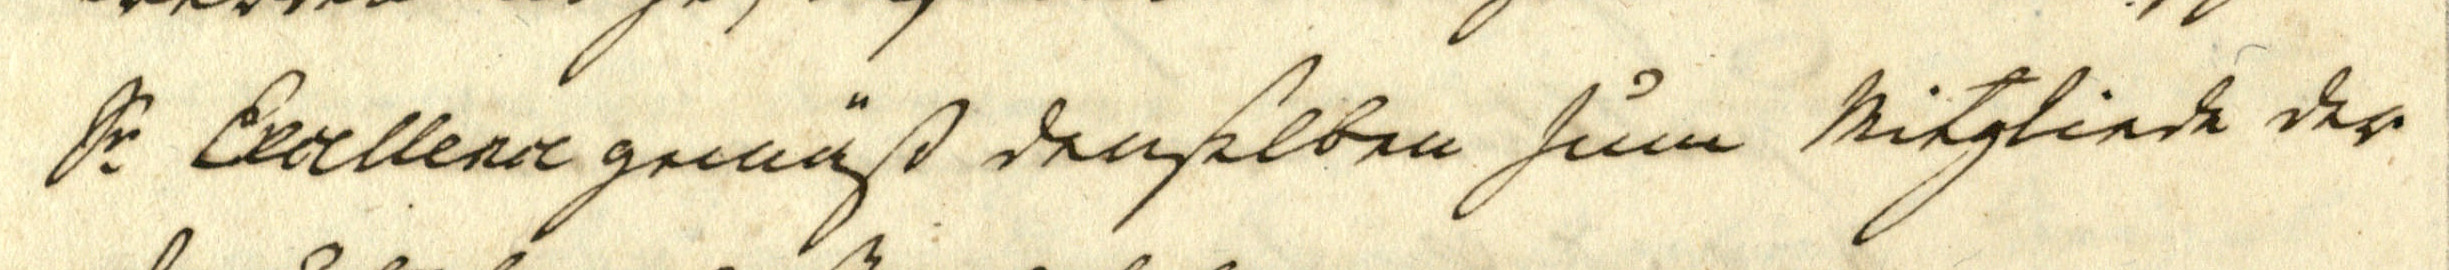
Sr. Excellence gemäß denselben zum Mitgliede der
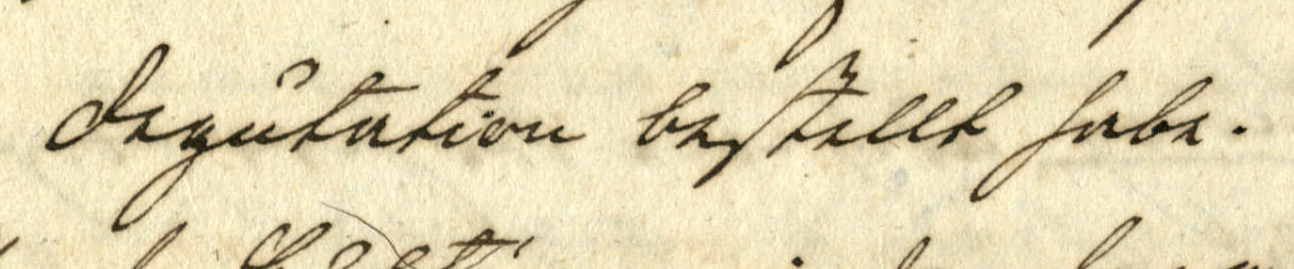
Deputation bestellt habe.
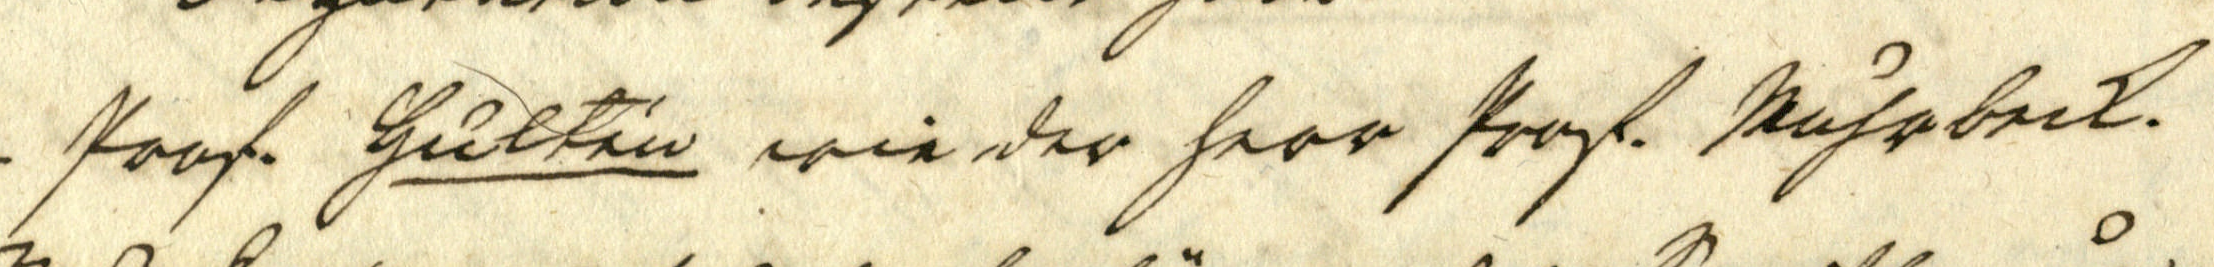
Prof. Hultén wie der Herr Prof. Muhrbeck.
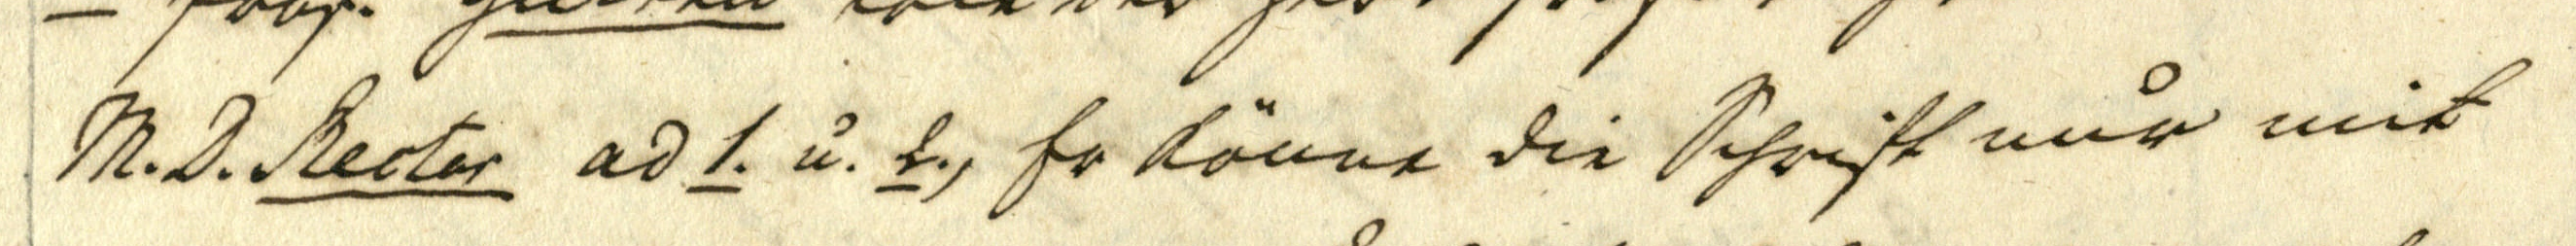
M. D. Rector ad 1. u. 2., Er könne die Schrift nur mit
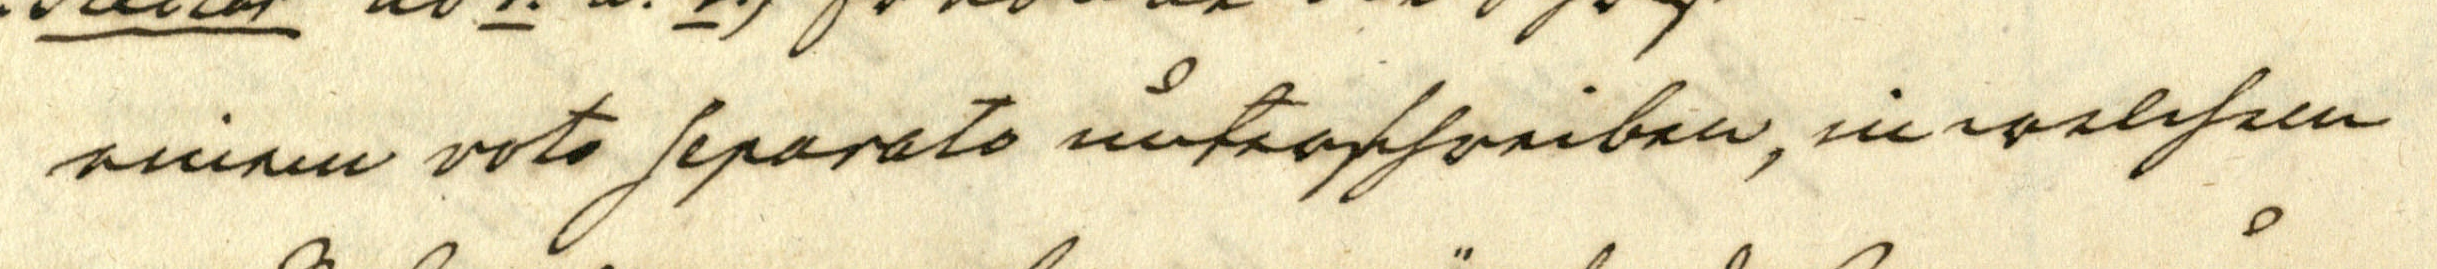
einem voto separato unterschreiben, in welchem
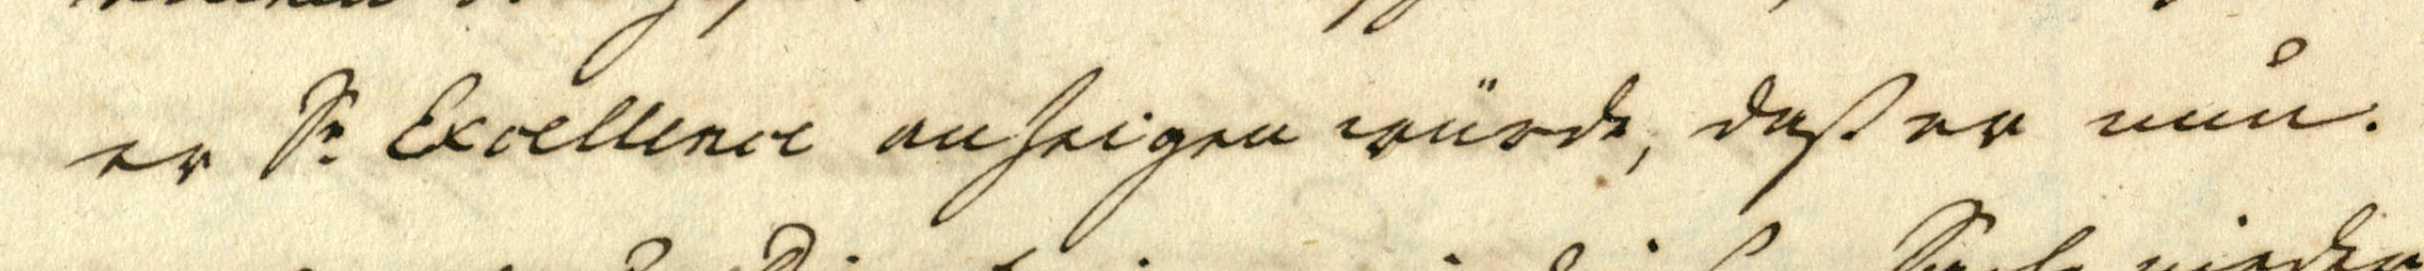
er Sr Excellence anzeigen würde, daß er nun¬
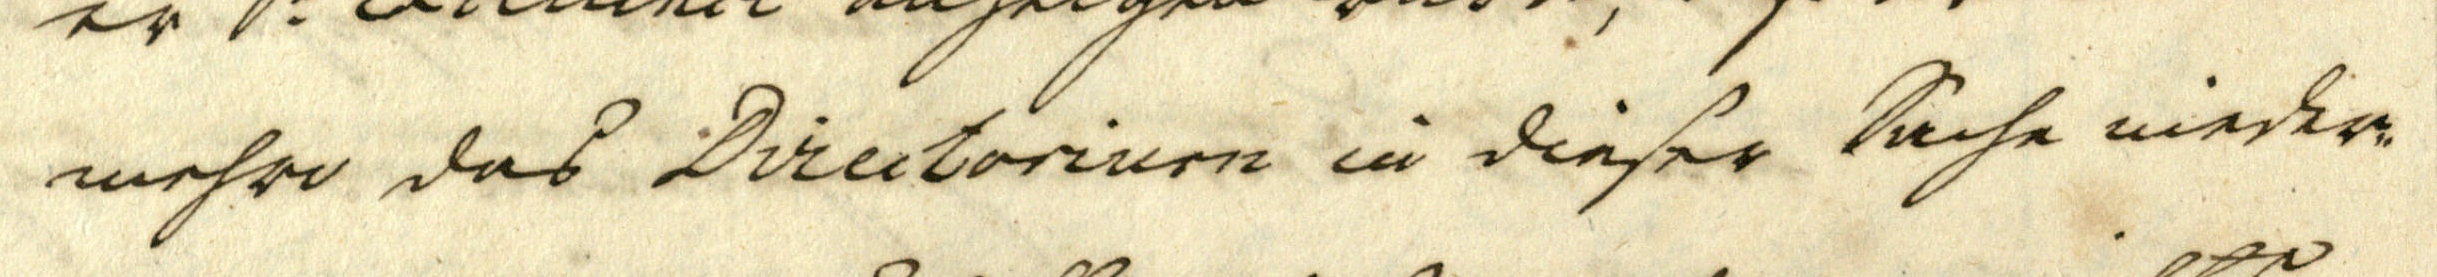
mehro das Directorium in dieser Sache nieder¬
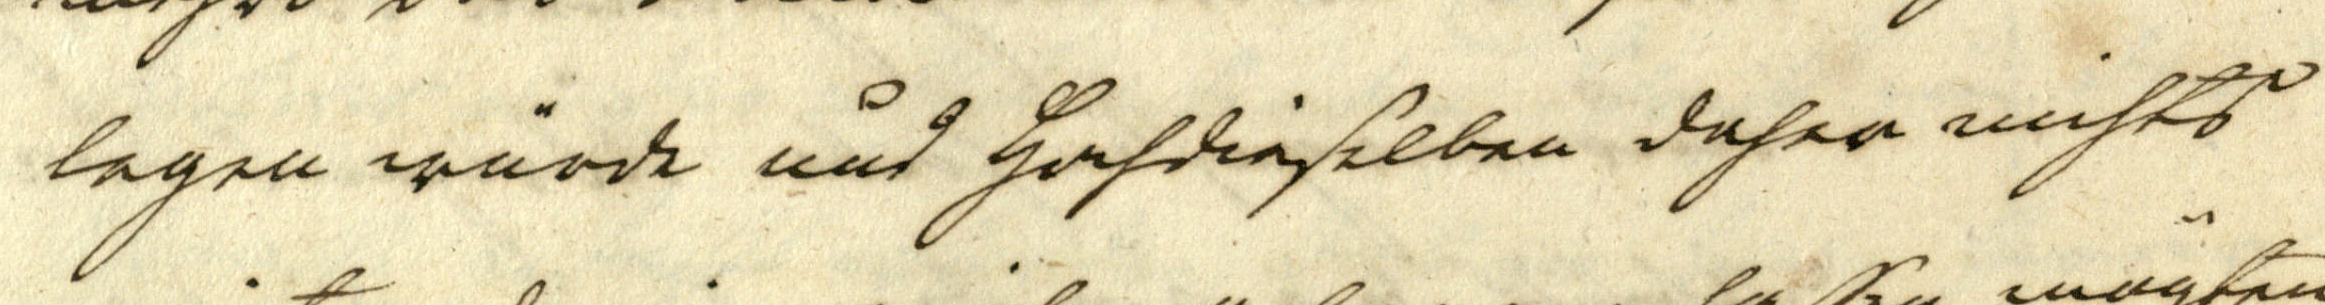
legen würde und Hochdieselben daher nichts
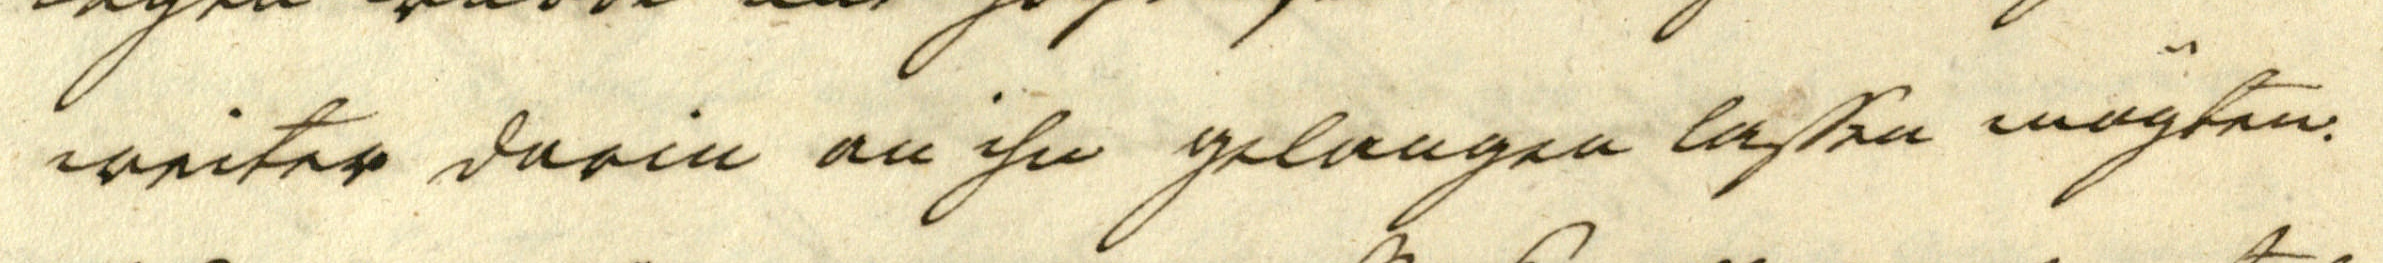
weiter darin an ihn gelangen lassen mögten.
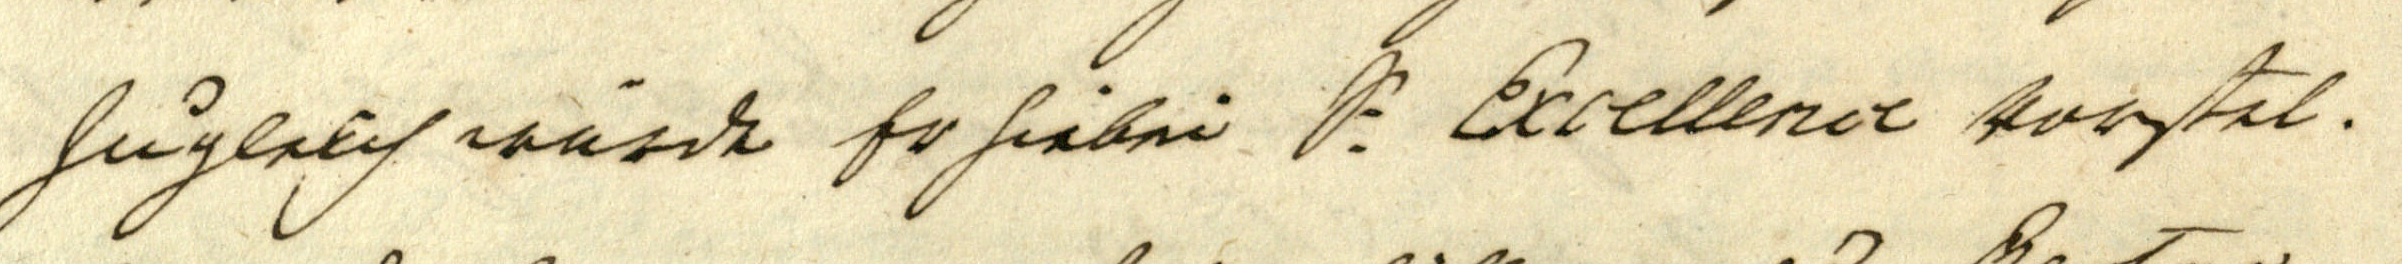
Zugleich würde Er hiebei Sr. Excellence vorstel¬
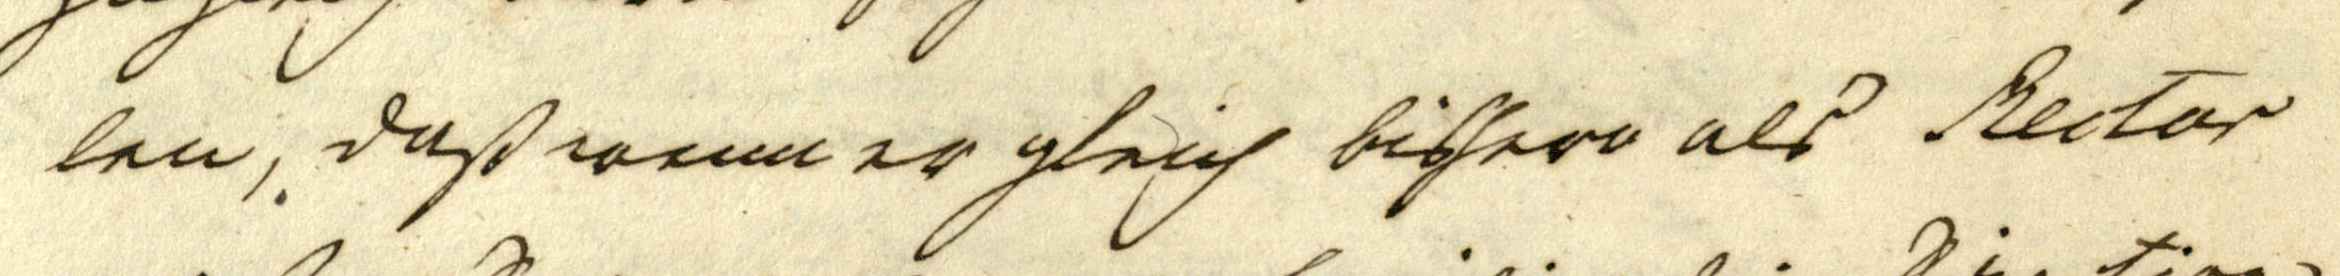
len, daß wenn er gleich bishero als Rector
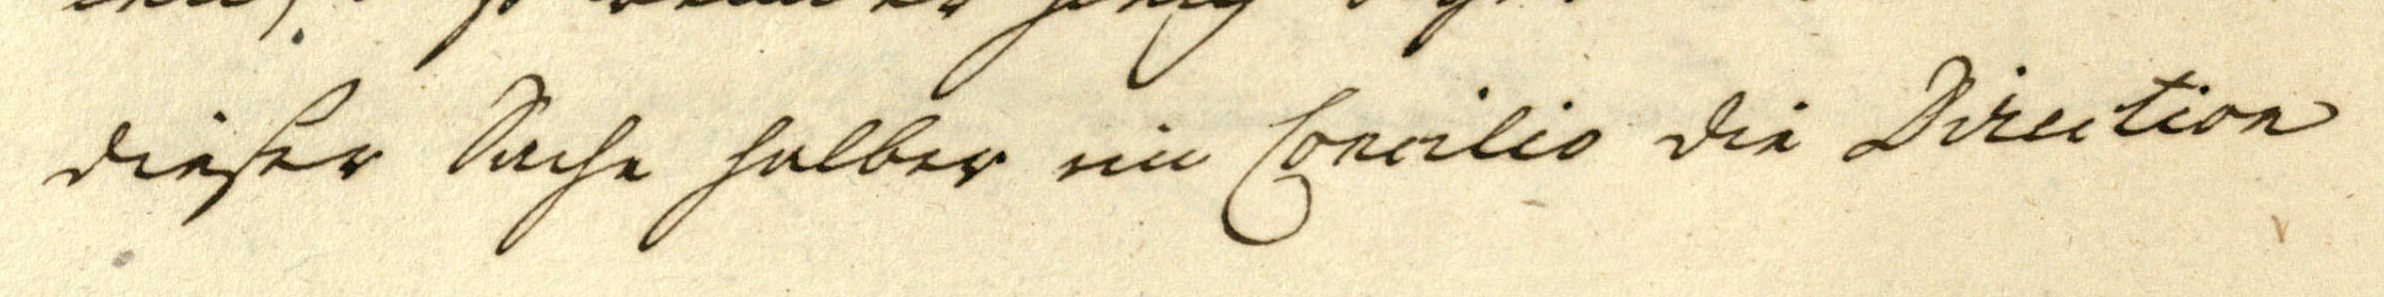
dieser Sache halber im Concilio die Direction
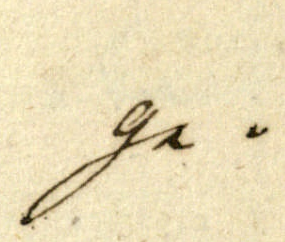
ge.
